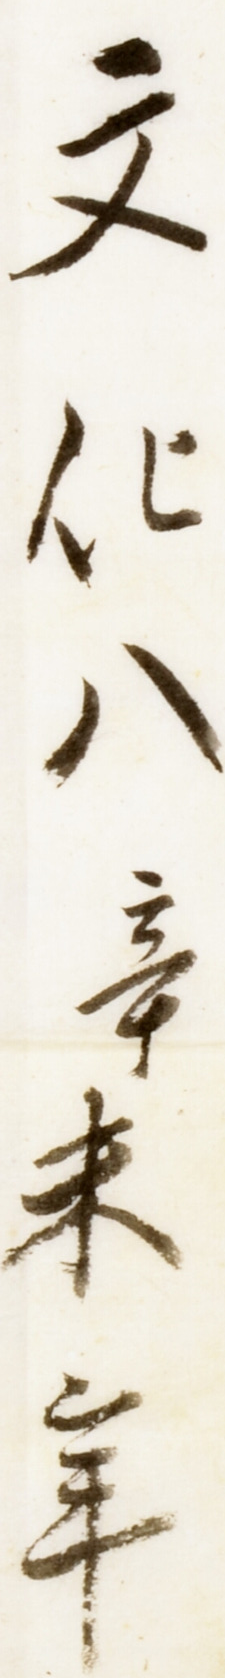文化八辛未年
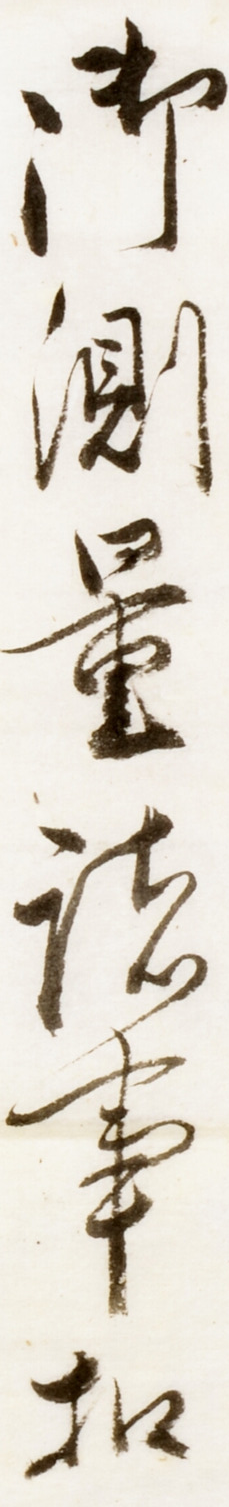御測量諸事扣
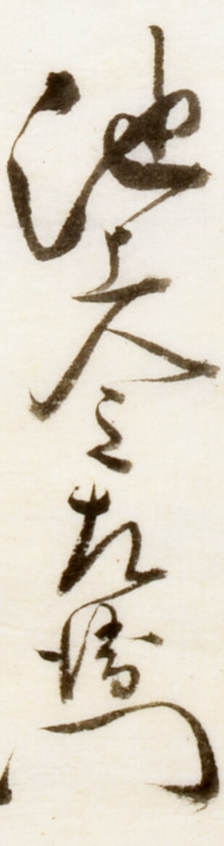池上金左衛門

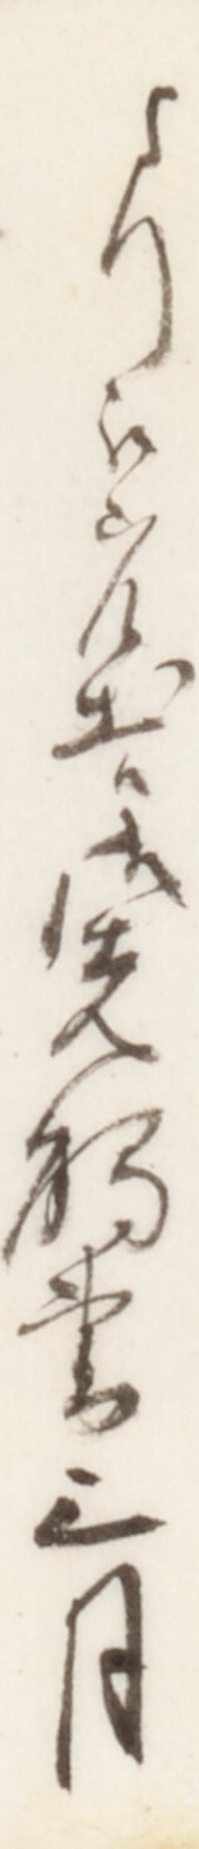より被差出候御先触書三月
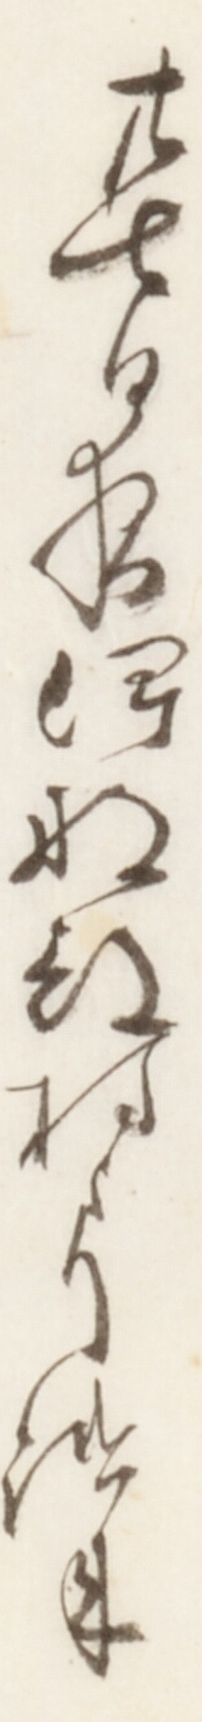廿七日之夜伊那部村より継来
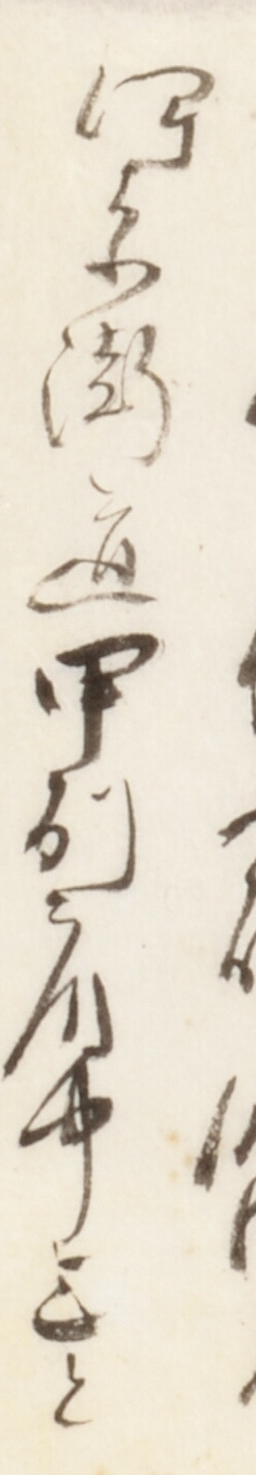伊奈街道甲州府中迄と
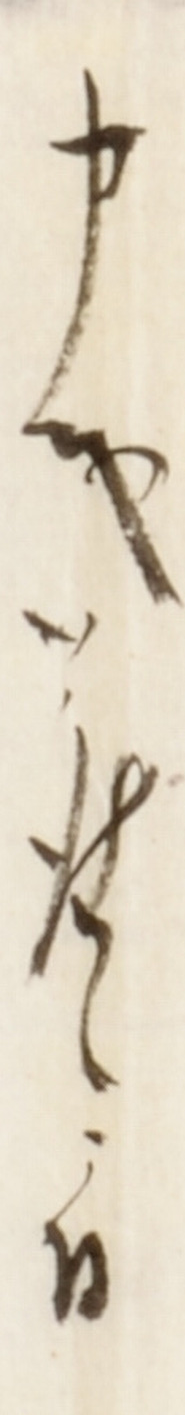申義御座候ニ付
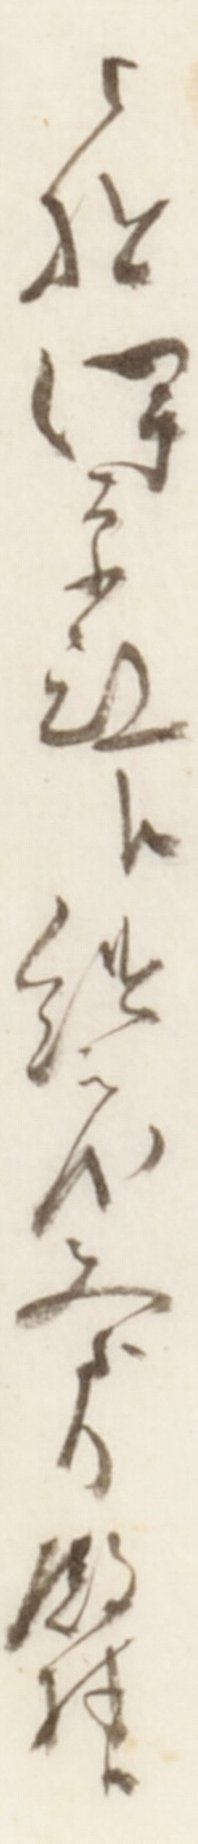被遊伊那部江継戻夫より殿村江
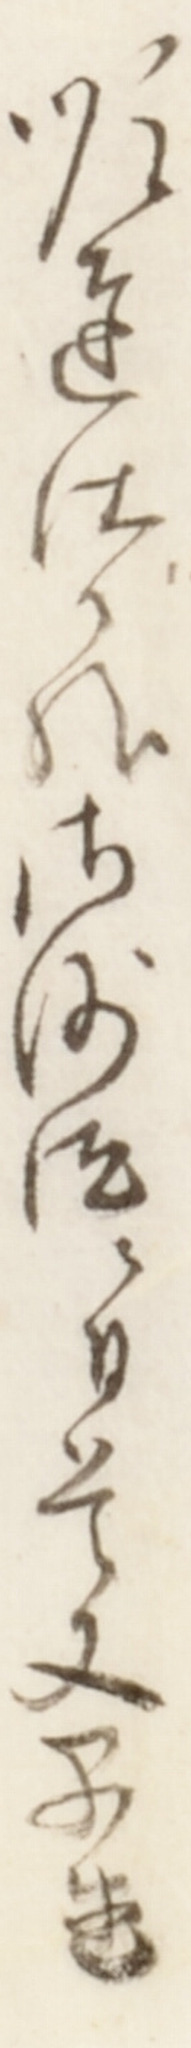順達仕候様御沙汰ニ付是また早速
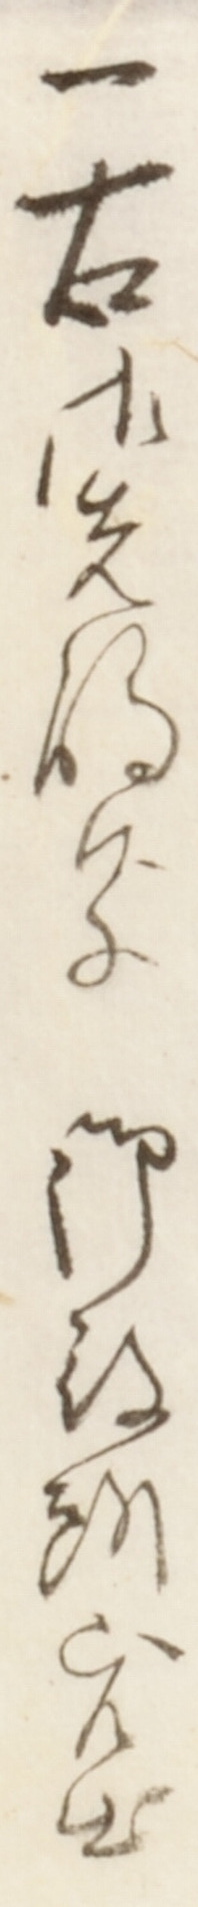一右御先触書御役所へ差出
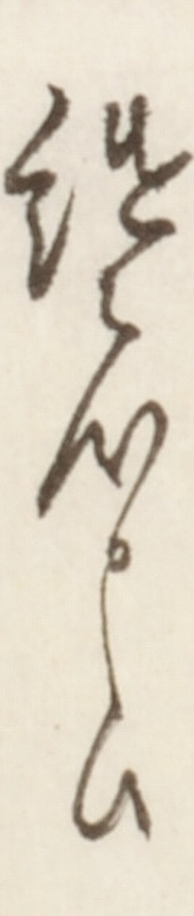継戻申候
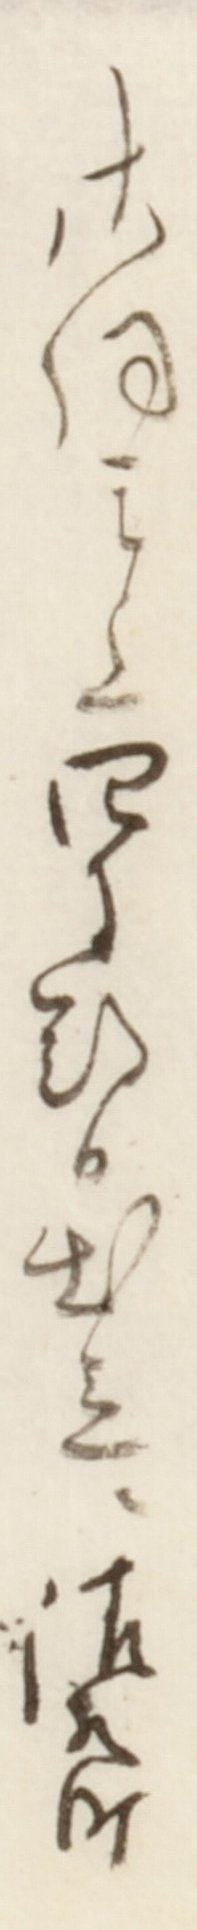御伺之上四月朔日出立ニ清水町
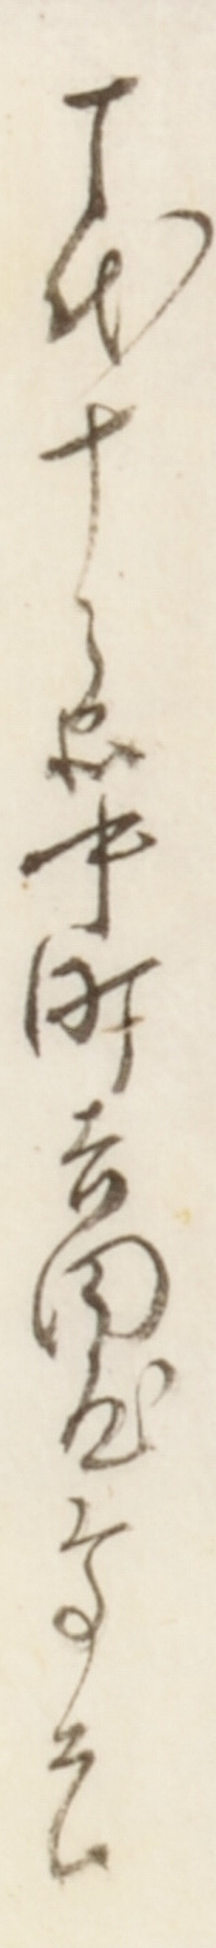丁代十兵衛中町吉田屋幸吉
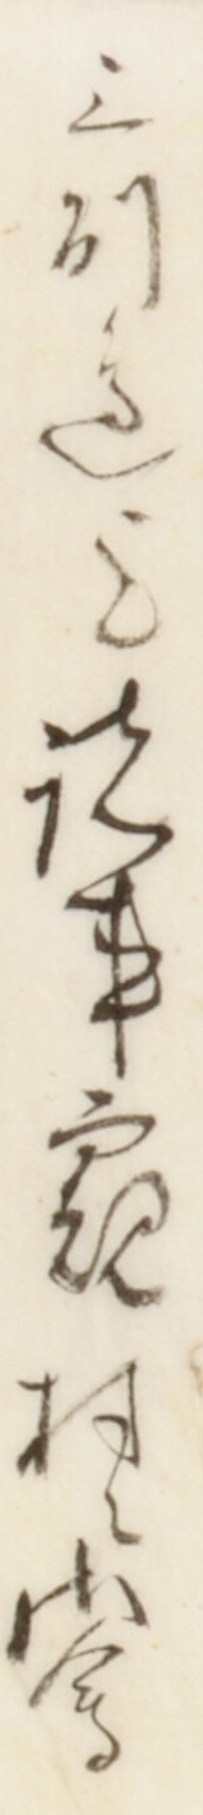三州辺迄諸事窺村々御会

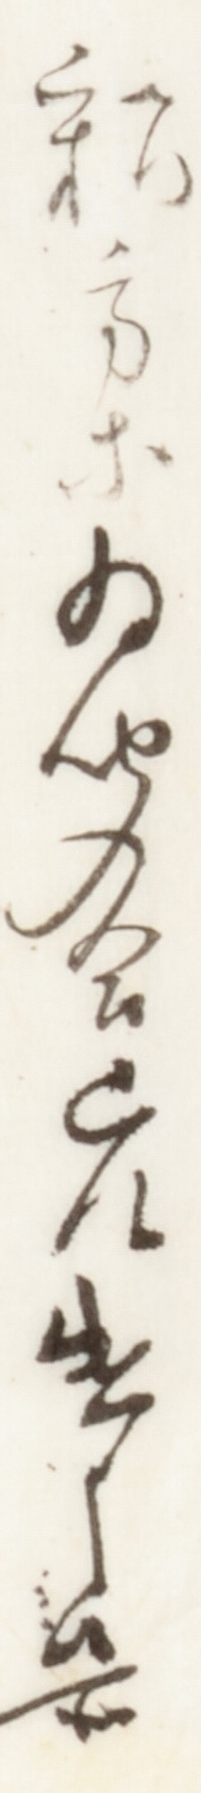釈方等聞合差遣申候所
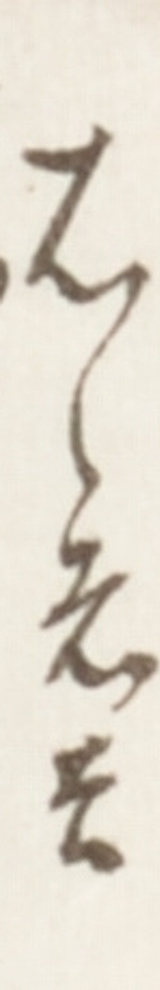右之者共
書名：御測量諸事控
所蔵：伊那市立高遠町図書館・合同会社AMANE
